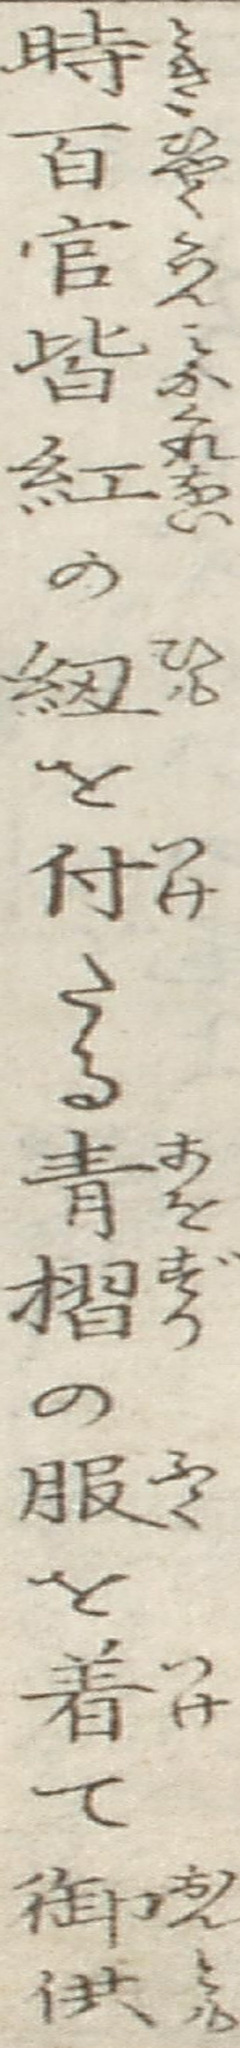時、百官皆紅の紐を付たる青摺の服を着て御供

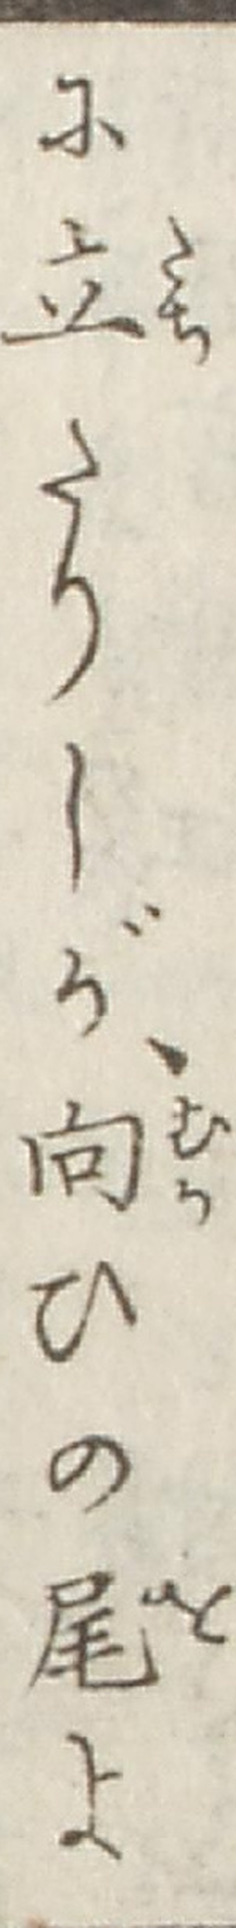に立たりしが、向ひの尾よ
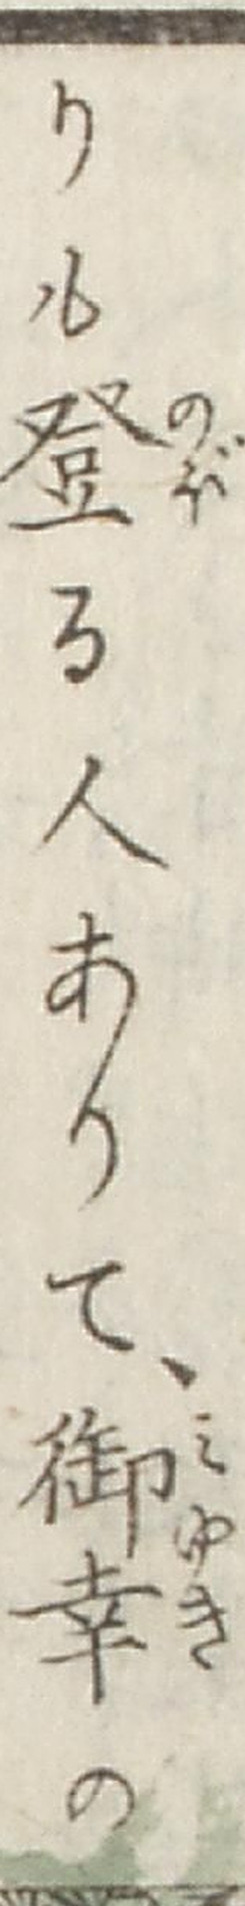りも登る人ありて、御幸の
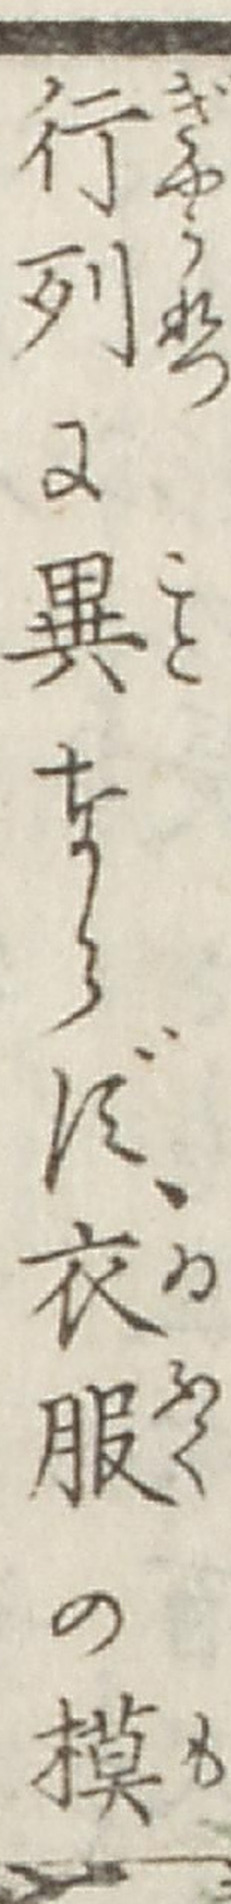行列に異ならず、衣服の模
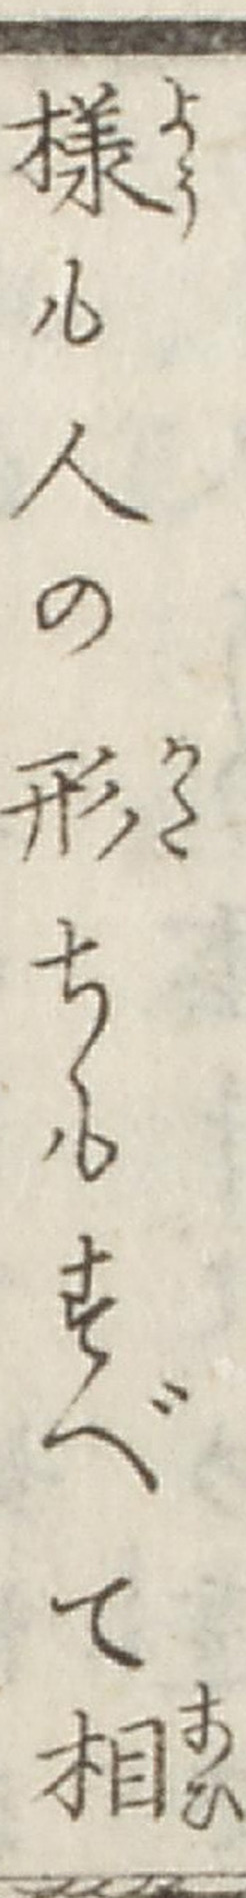様も人の形ちもすべて相
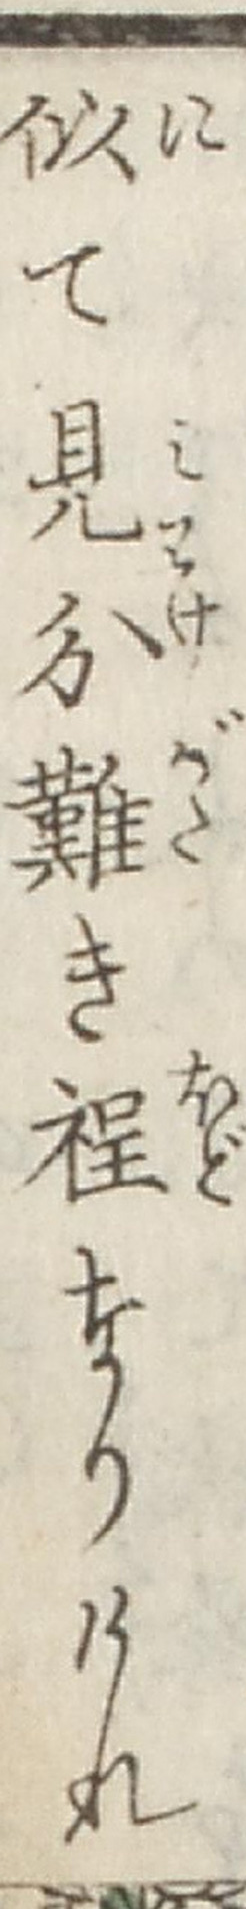似て見分難き程なりけれ
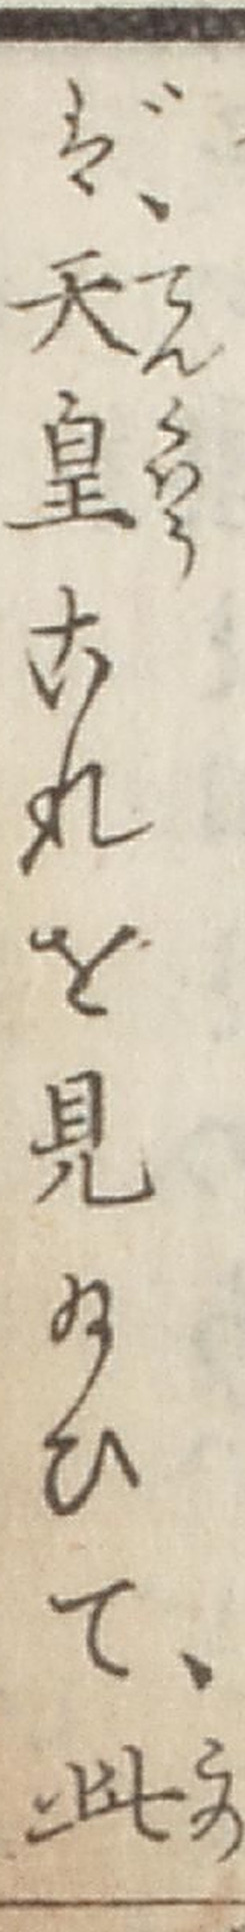ば、天皇これを見給ひて、此
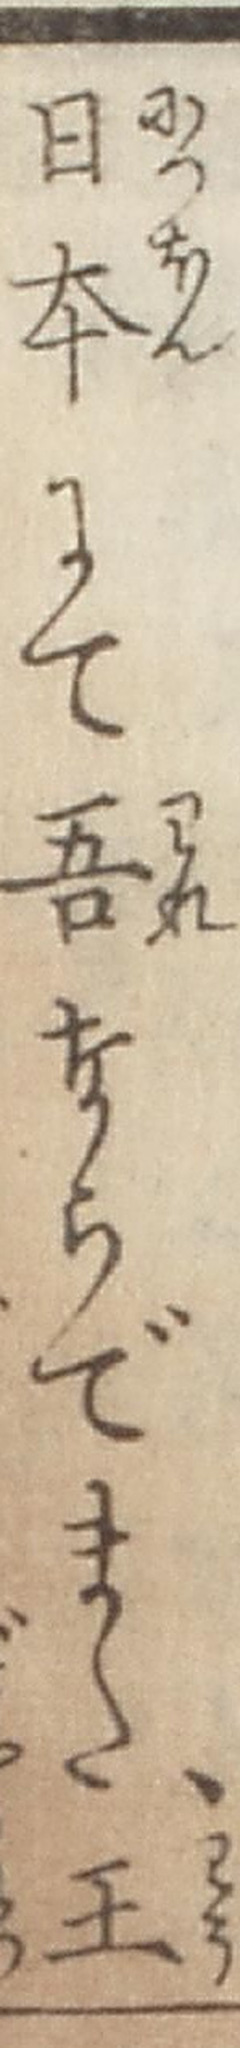日本にて吾ならでまた、王
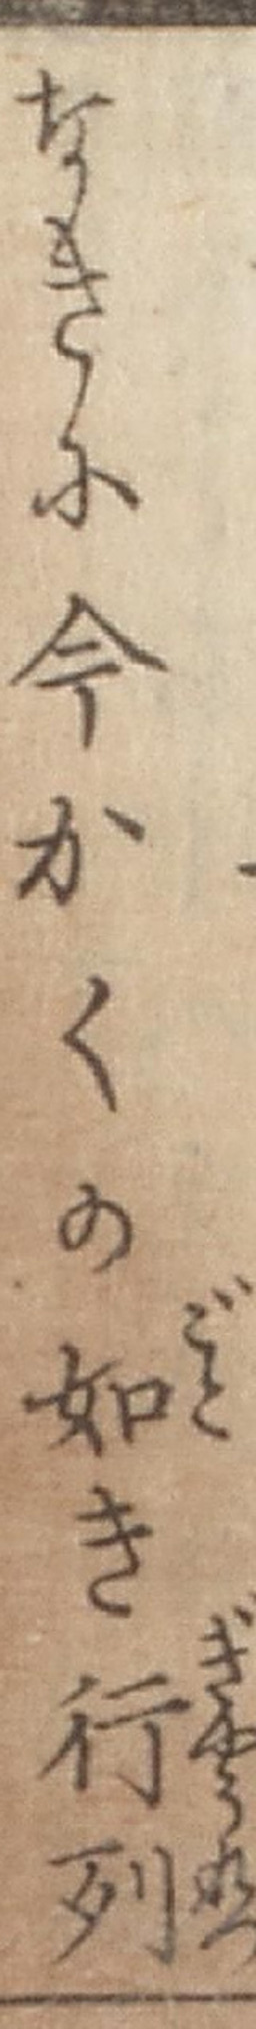なきに今かくの如き行列
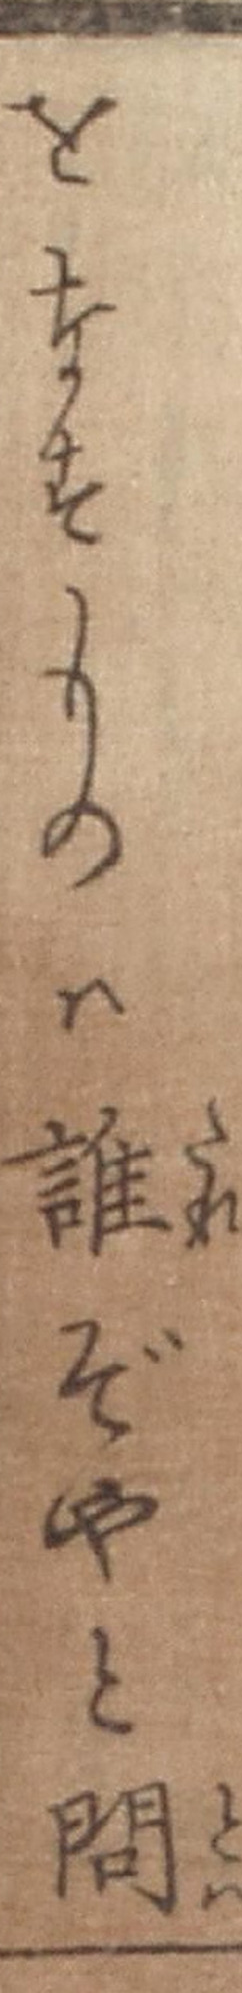をなすものは誰ぞやと問
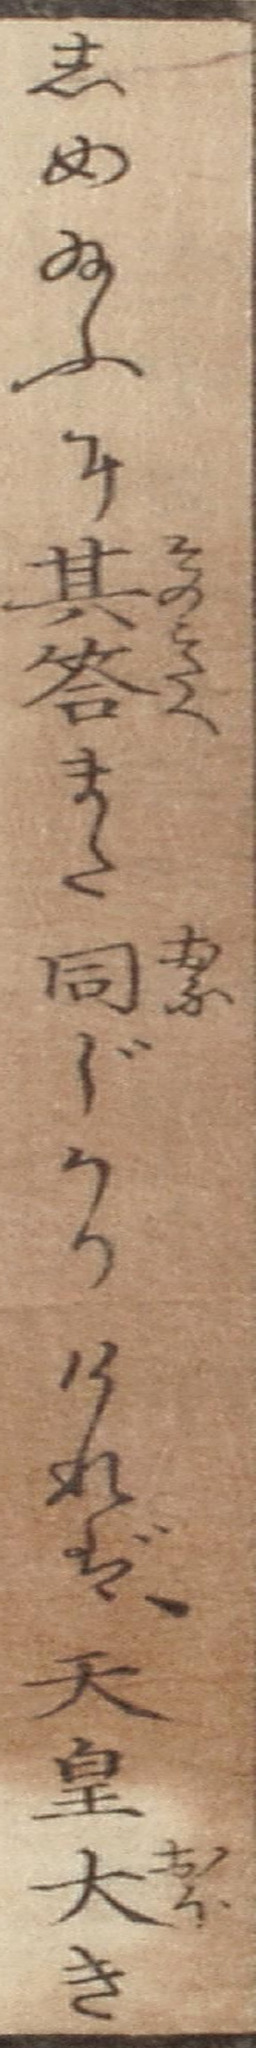しめ給ふに其答また同じかりければ、天皇大き
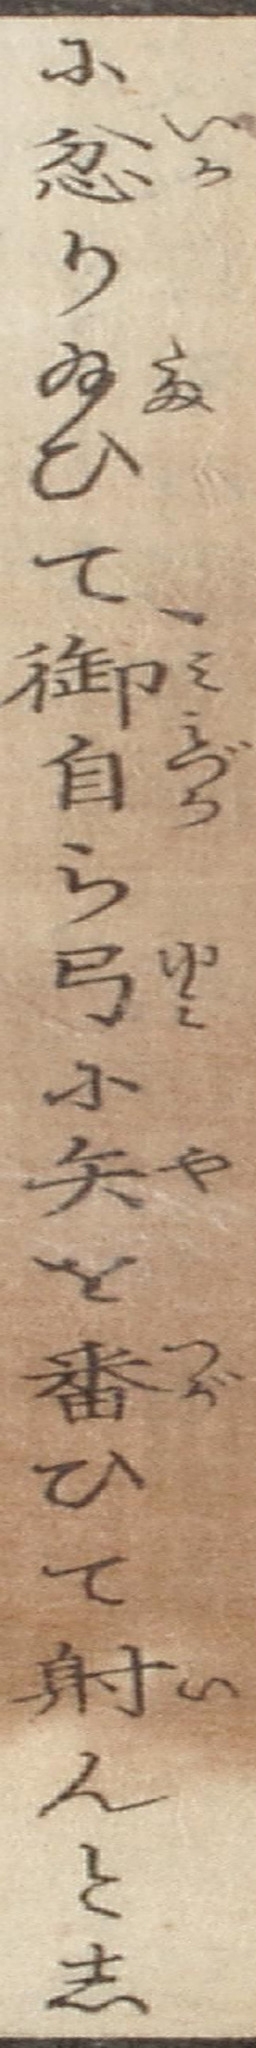に忿り給ひて、御自ら弓に矢を番ひて射んとし
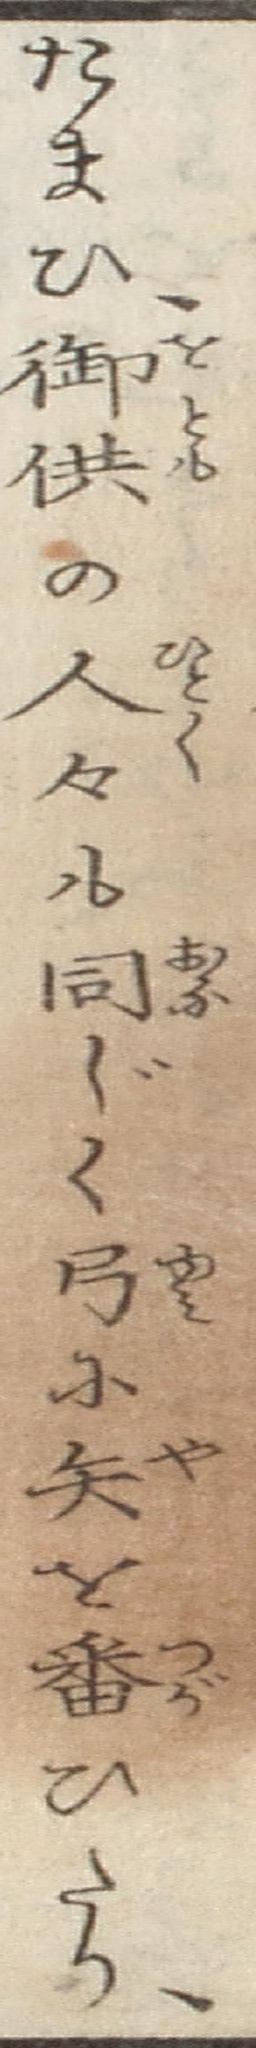たまひ、御供の人々も同じく弓に矢を番ひたり、
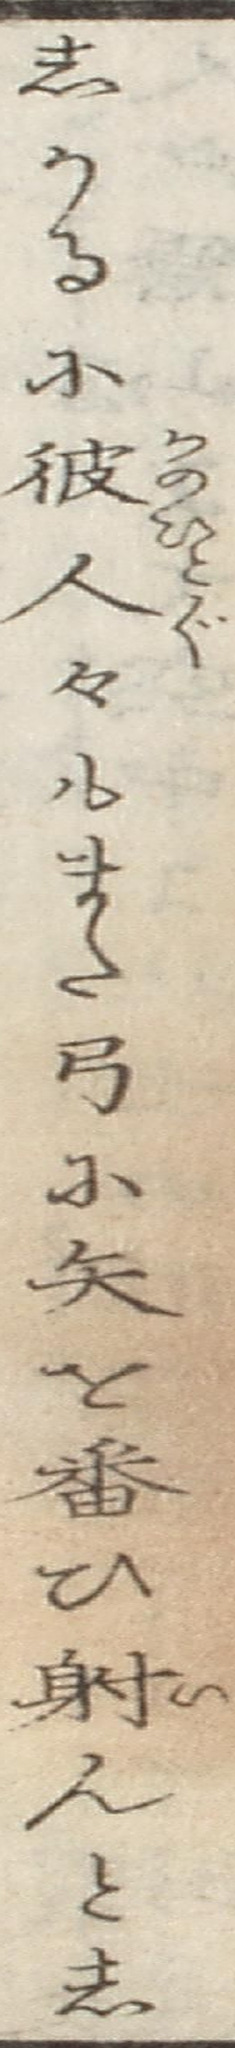しかるに彼人々もまた弓に矢を番ひ射んとし
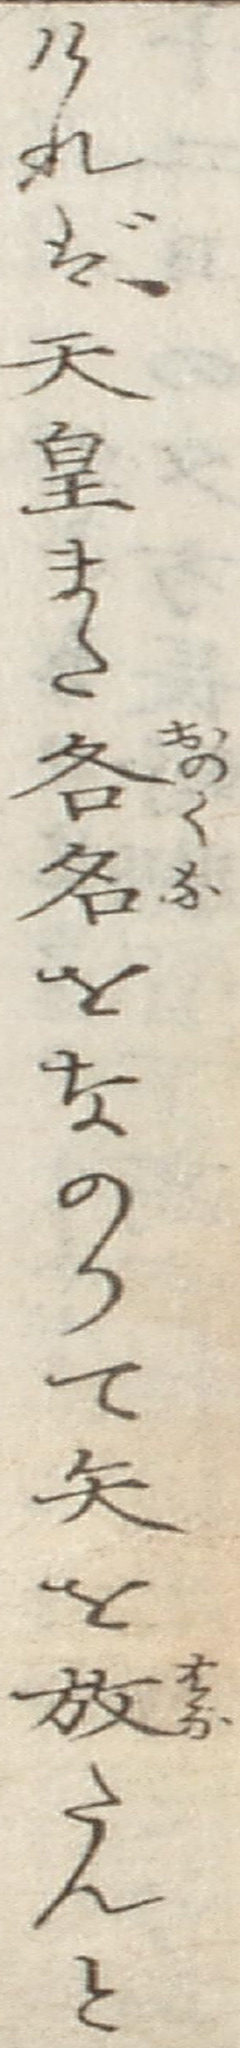ければ、天皇また各名をなのりて矢を放たんと
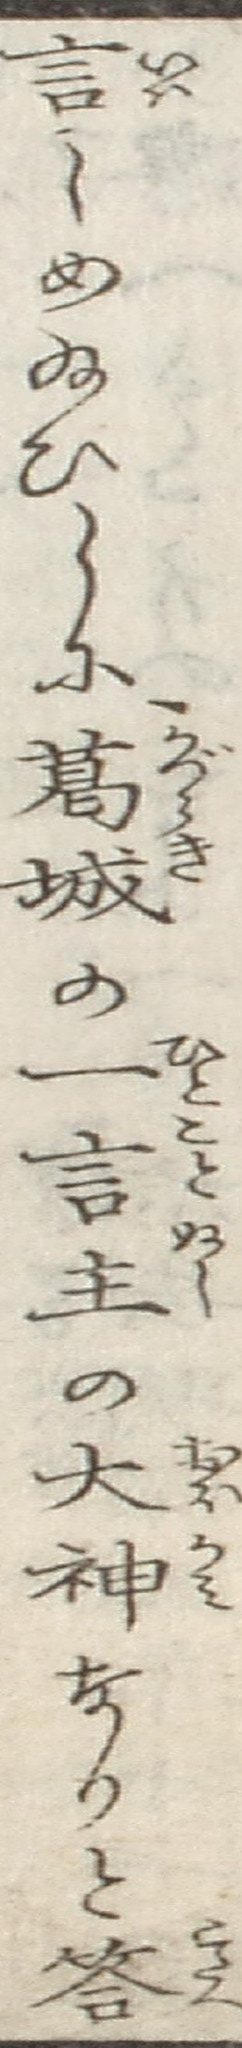言しめ給ひしに、葛城の一言主の大神なりと答
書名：変異辯　一名、天變地異拾遺　全
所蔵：東京大学地震研究所図書室 Earthquake Research Institute Library, The University of Tokyo, JAPAN
